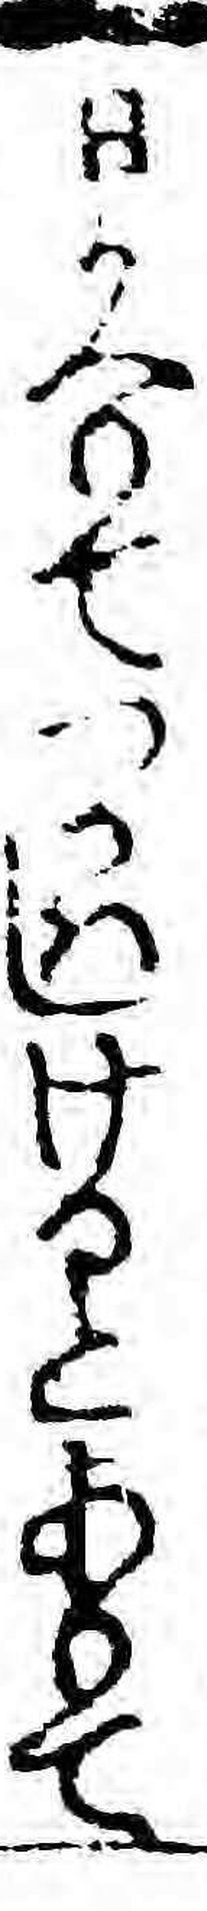日かへりてつかはしけるとありて
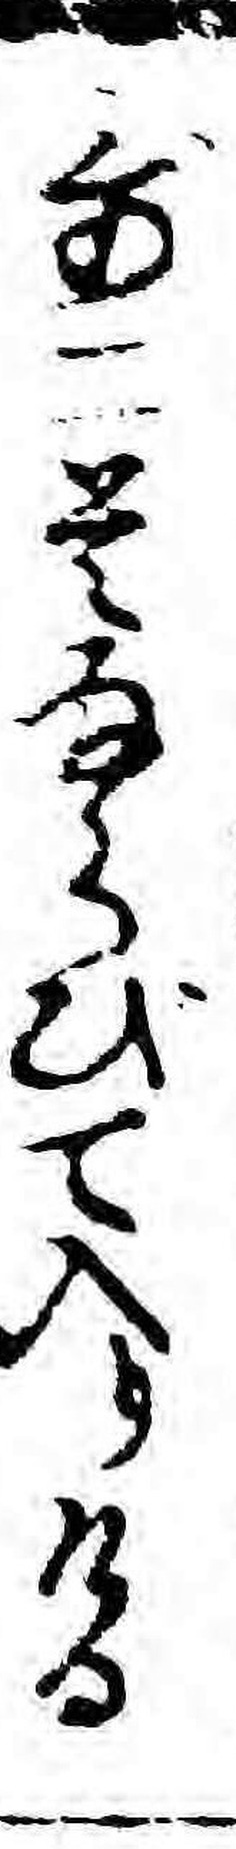哥二首ならびて入りける
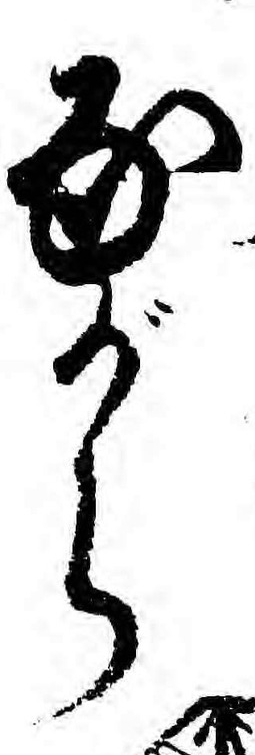ながら
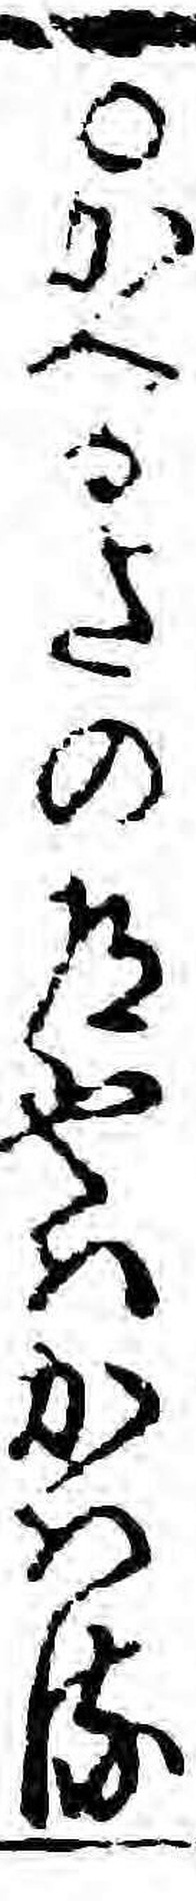〇かへるさの道やはかはる
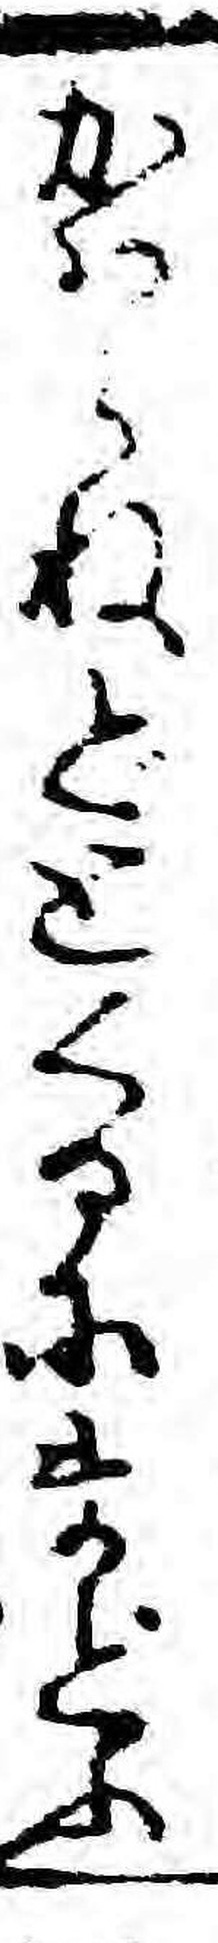かはらねどとくるにまどふ
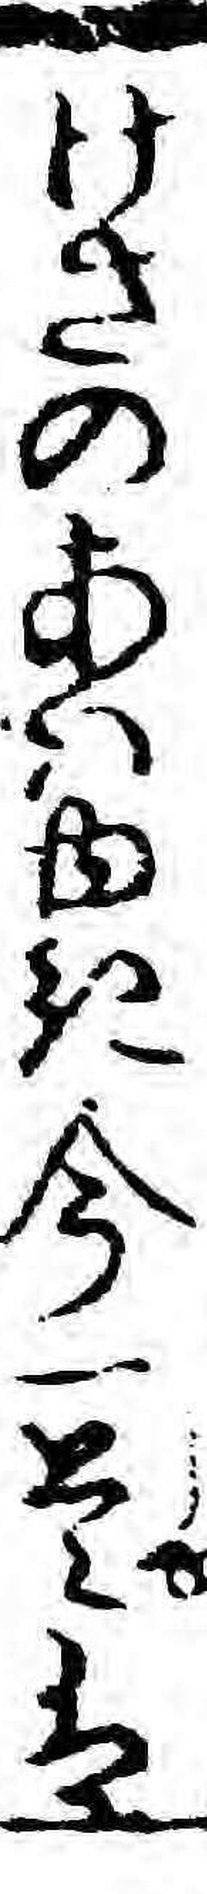けさのあはゆき今一首は
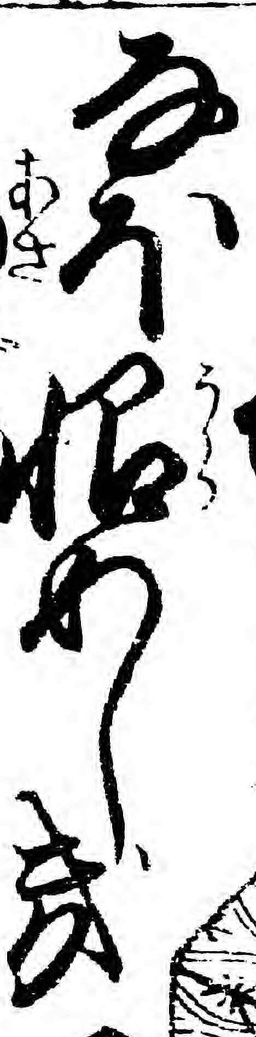なほ恨めしき
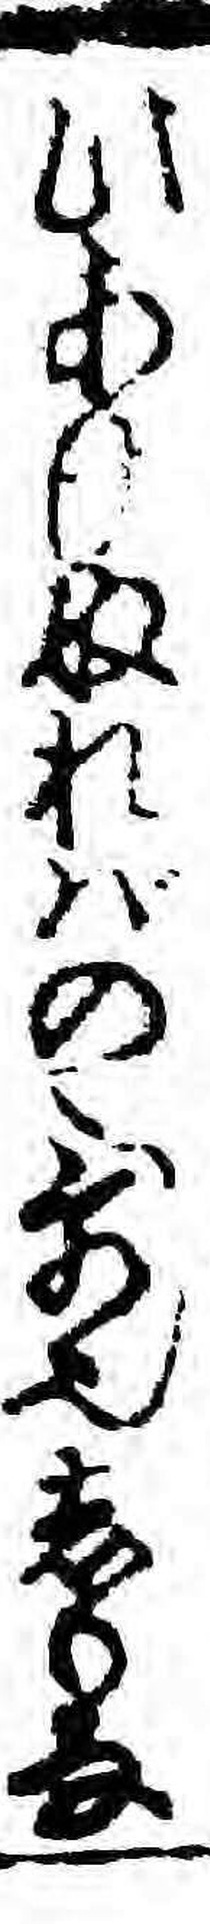此あけぬればの哥也しりな
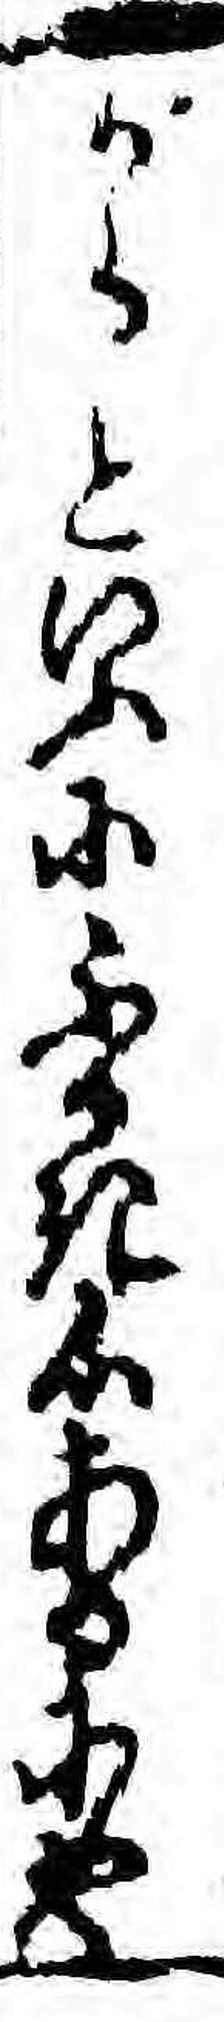がらといふにふかき心あるにや
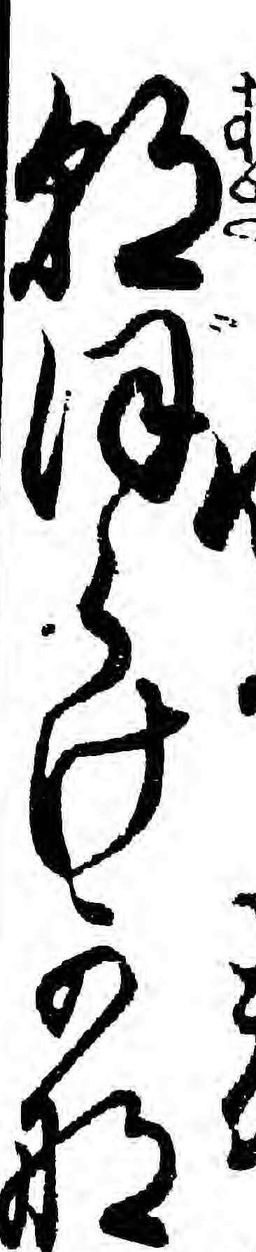朝ぼらけかな
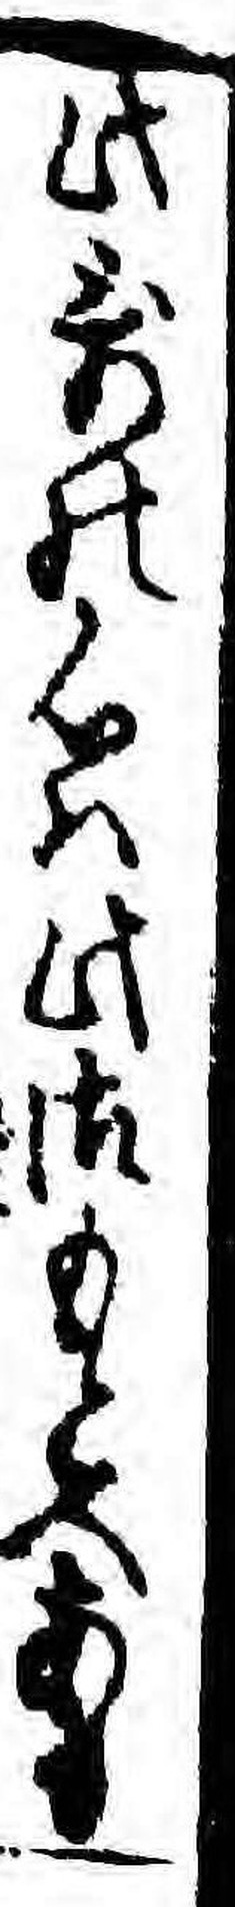此哥の心は此御もとへある
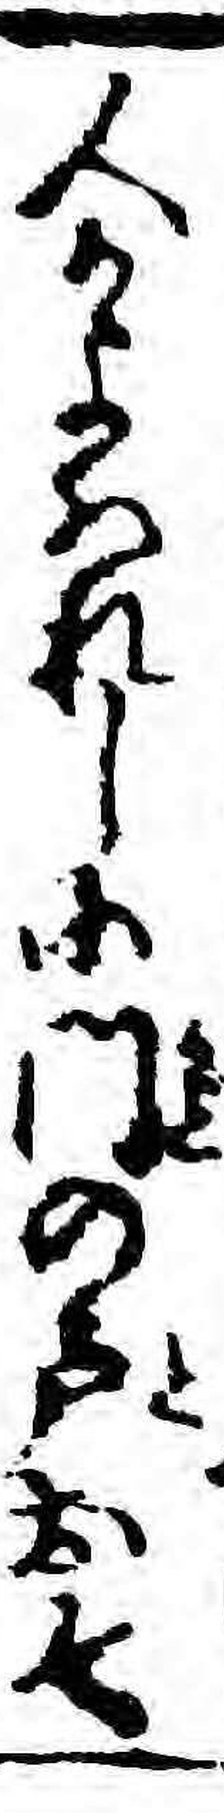人かよはれしに門の戸おそ
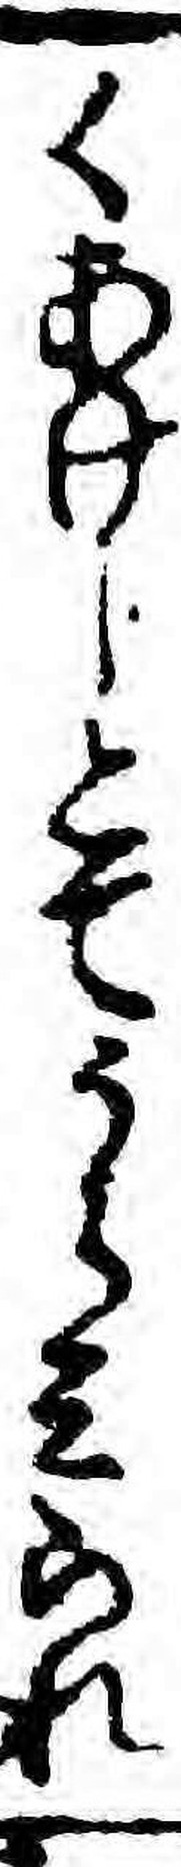くあけしとてうらみられ
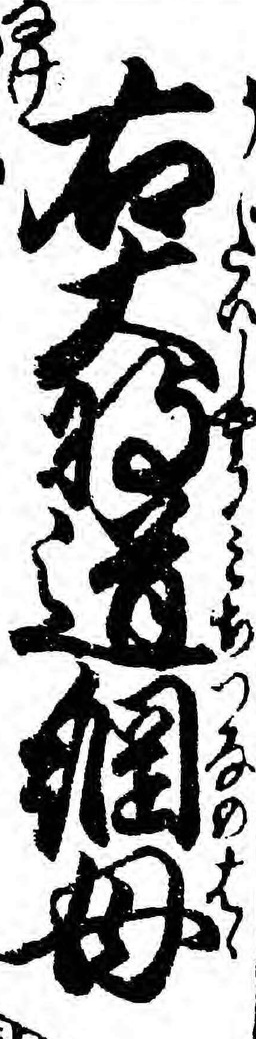右大将道綱母
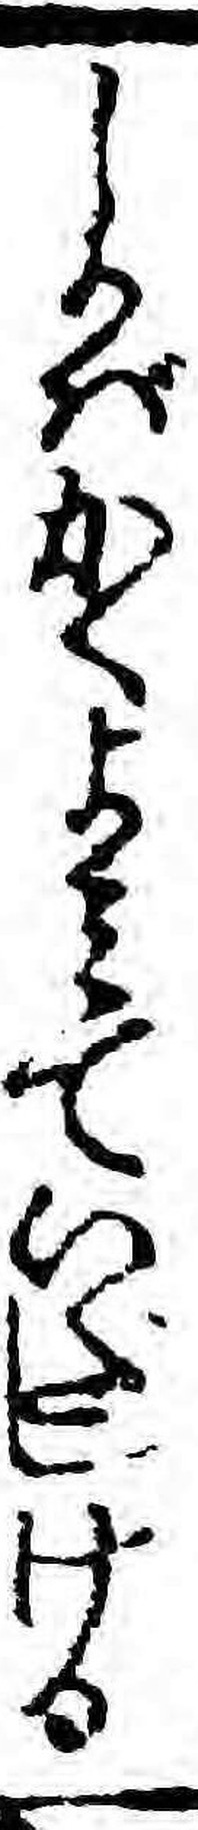しかばかくよみていだしける
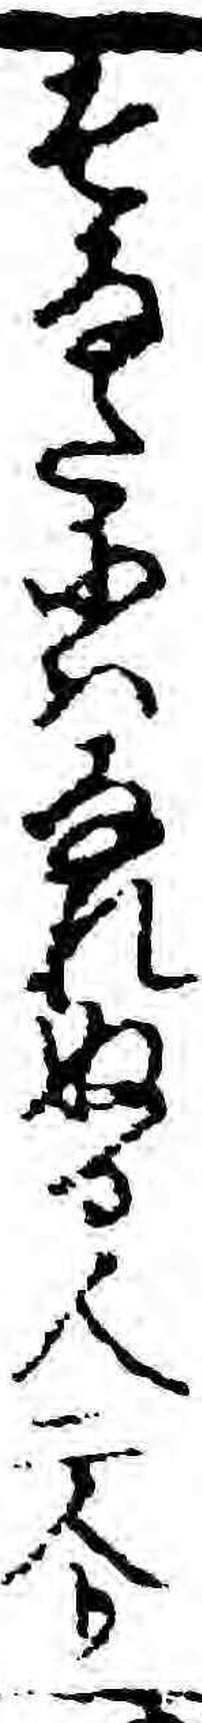そなたにはなれぬる人二人り
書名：頭書和歌注譯／壽賀多百人一首小倉錦
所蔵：国文学研究資料館
